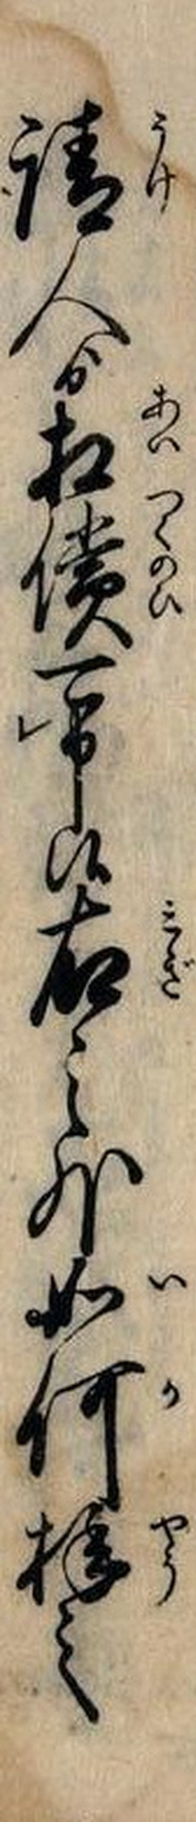請人ゟ相償可申候右之外如何様之
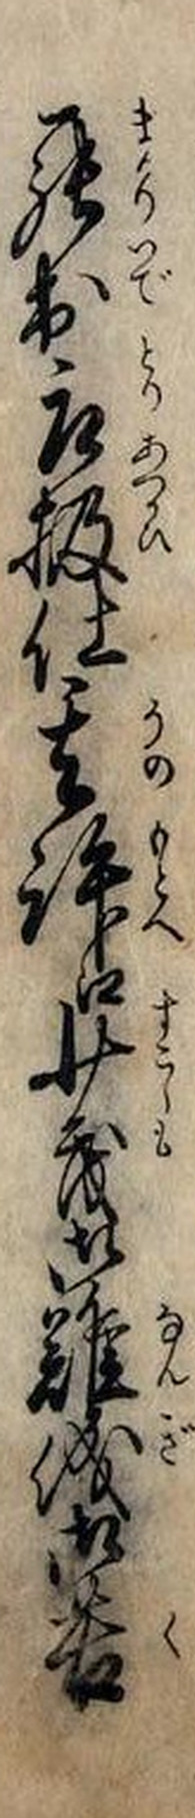罷出取扱仕其許江少も御難儀御苦
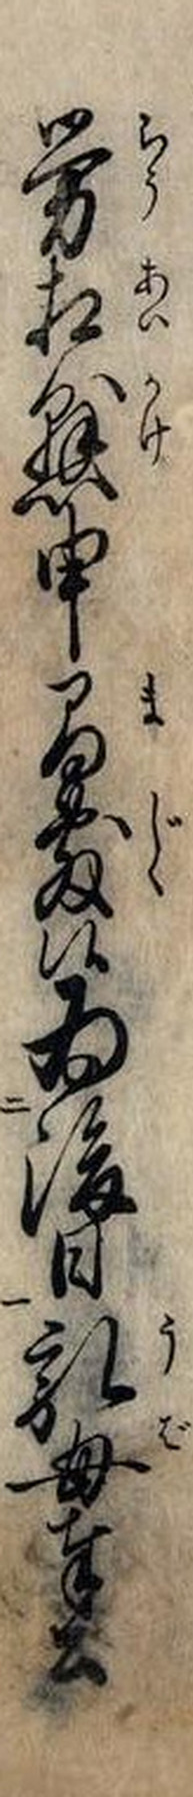労相懸申間敷候為後日乳母奉公

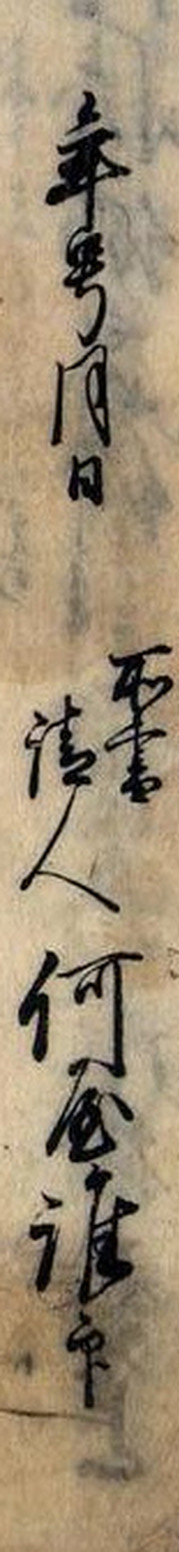年号月日請人何屋誰印
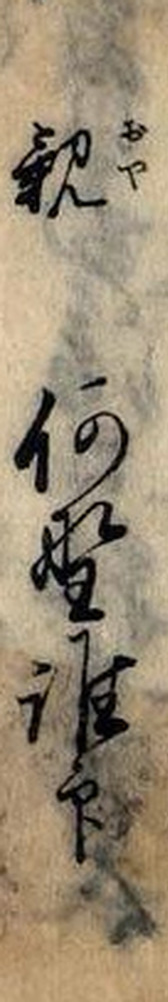親何野誰印
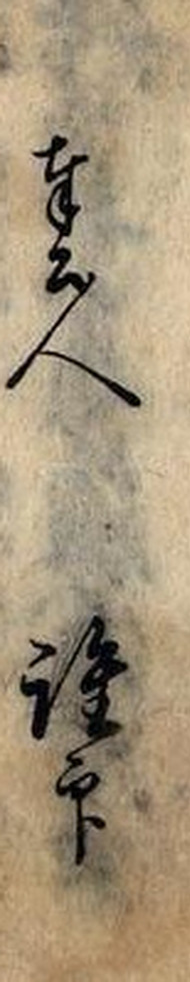奉公人誰印
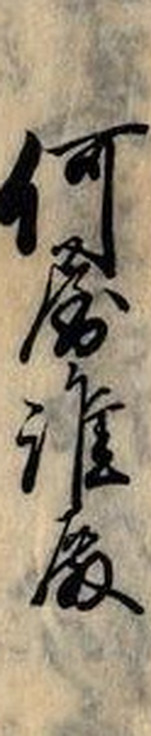何屋誰殿
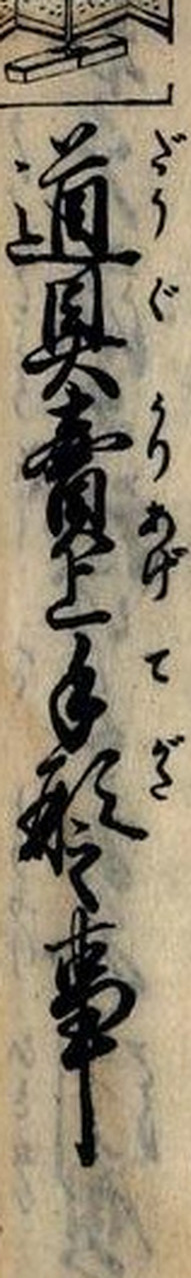道具賣上手形之事
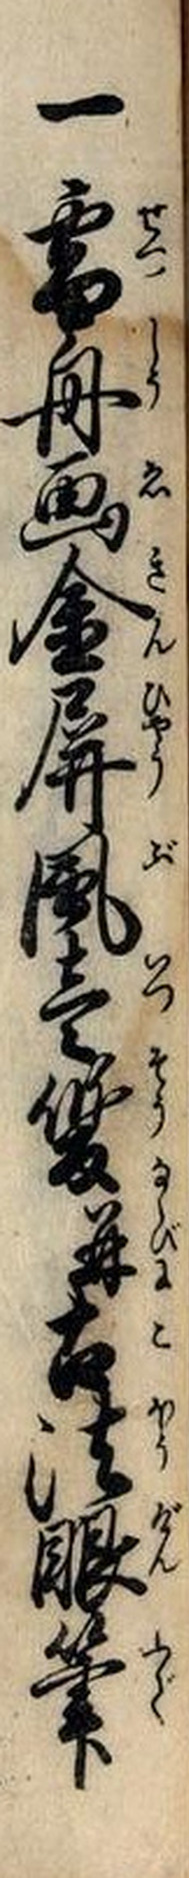一雪舟画金屛風壱雙并古法眼筆
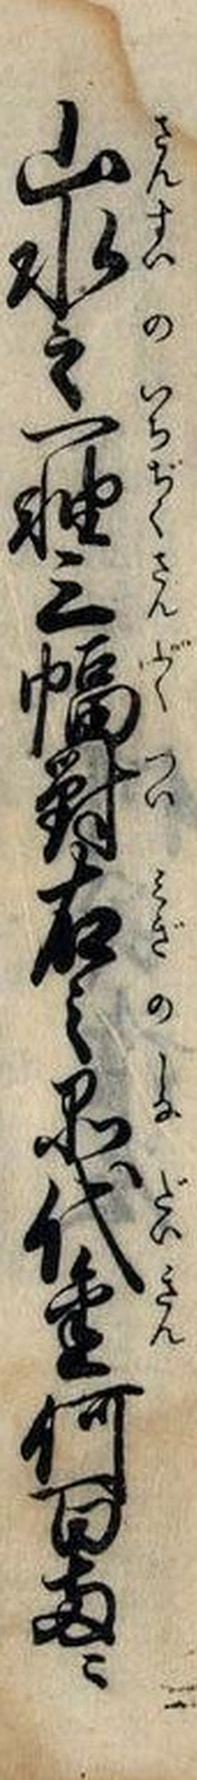山水之一軸三幅對右之品代金何百両に
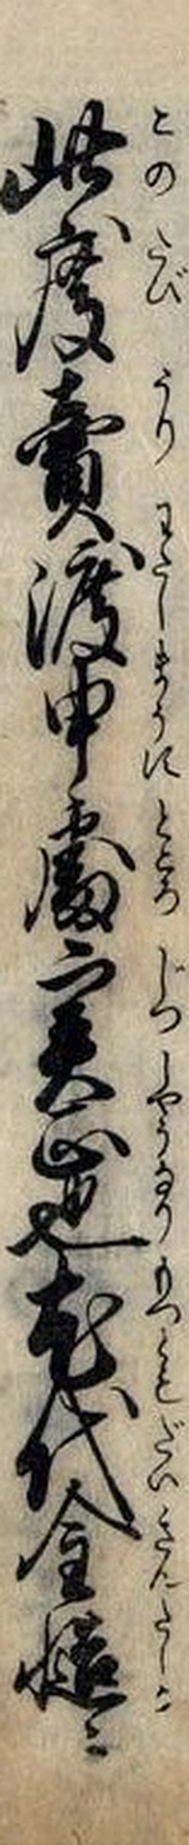此度賣渡申處実正也尤代金慥に
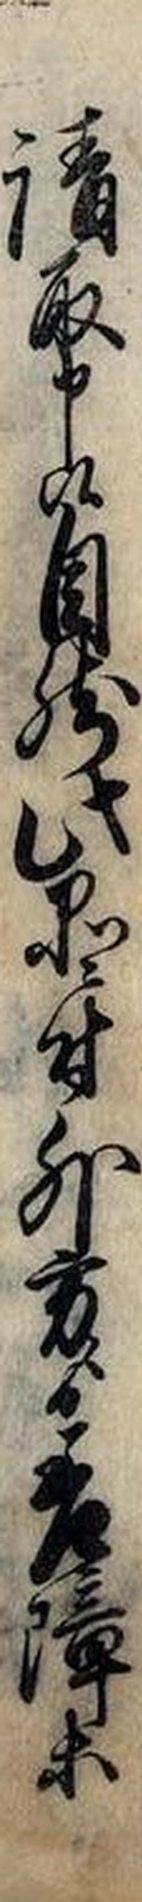請取申候自然此品に付外方ゟ差障等
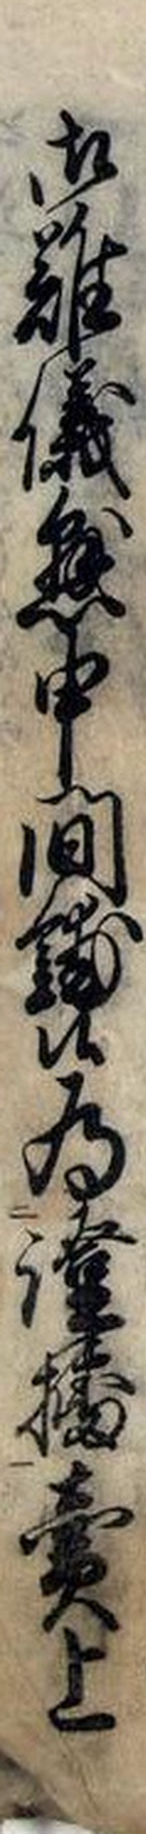御難儀懸申間鋪候為證據賣上

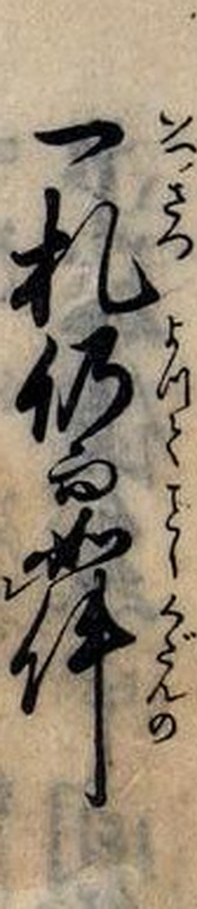一札仍而如件
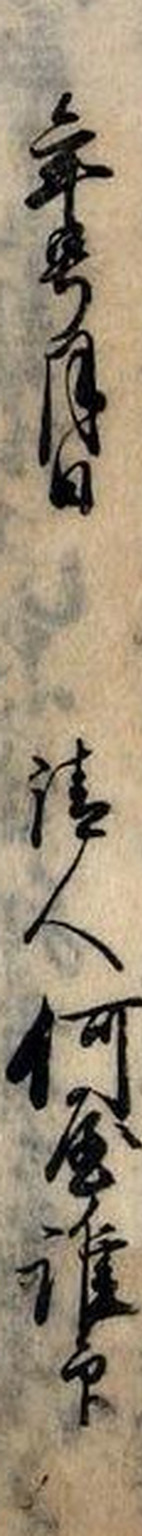年号月日請人何屋誰印
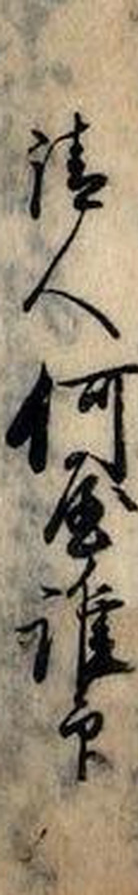賣主何屋誰印
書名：大成用文章（往来物）
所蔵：福井県文書館 Fukui Prefectural Archives
